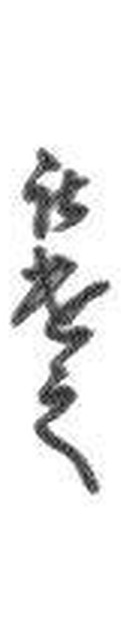被遣之
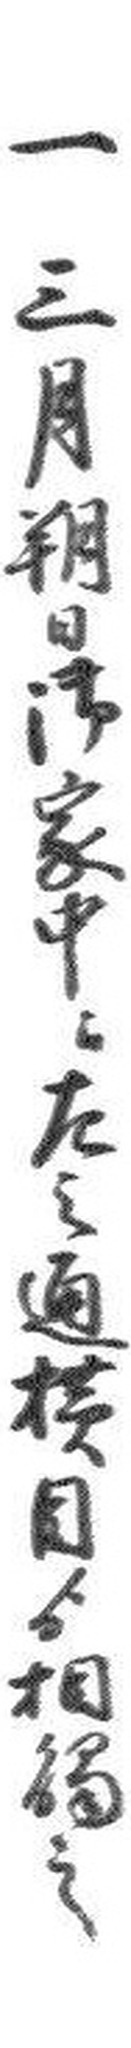一三月朔日御家中江左之通横目ゟ相触之
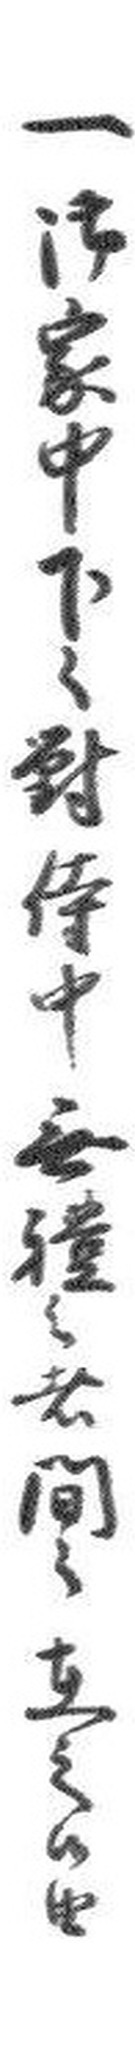一御家中下々對侍中無礼之者間々在之候由
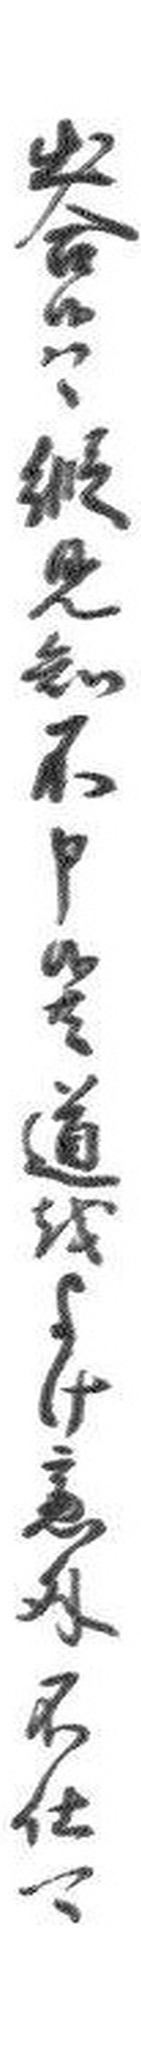出合候ㇵゝ縦見知不申候共道をよけ慮外不仕可
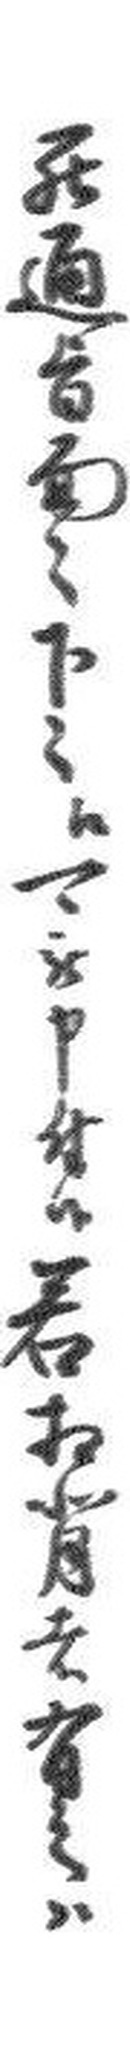罷通旨面々下々江可被申付候若相背者有之ㇵ

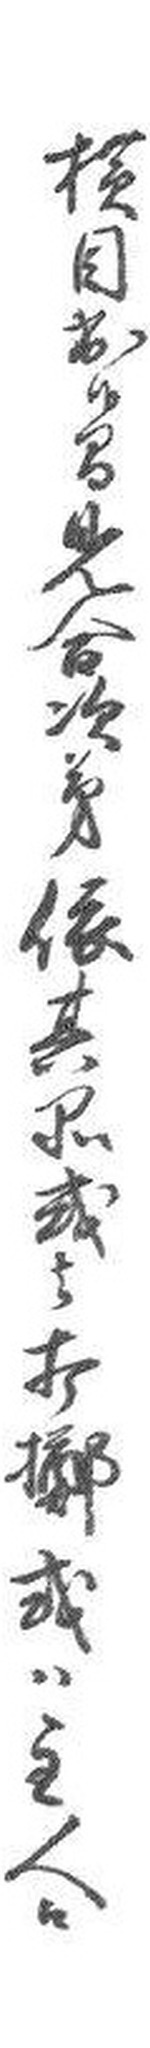横目出候間見合次第依其品或者相打擲或ㇵ主人江
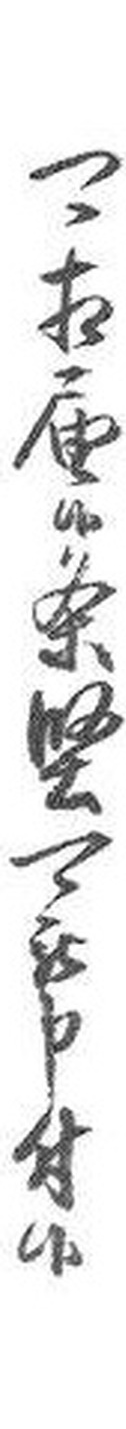可相届候条堅可被申付候
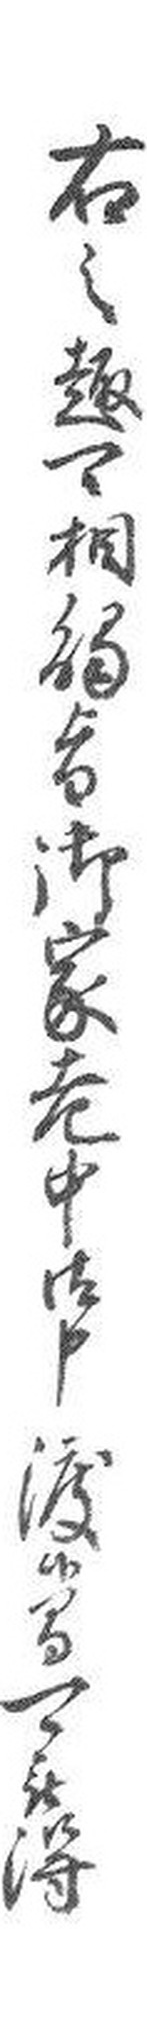右之趣可相触旨御家老中申渡候間可被得
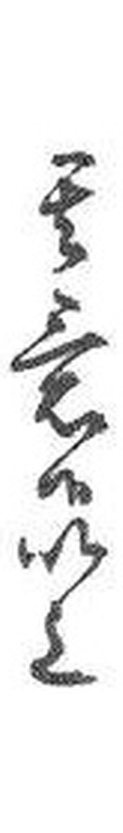其意候以上
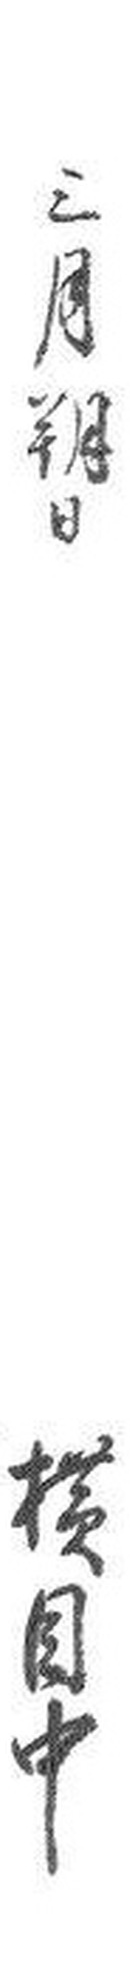三月朔日横目中
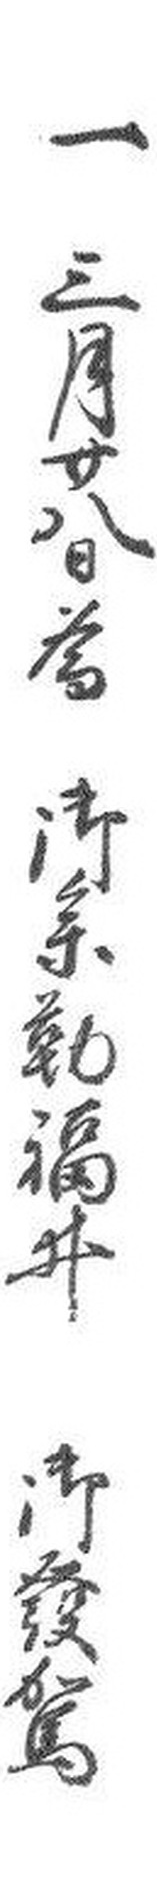一三月廿八日為御参勤福井御発駕
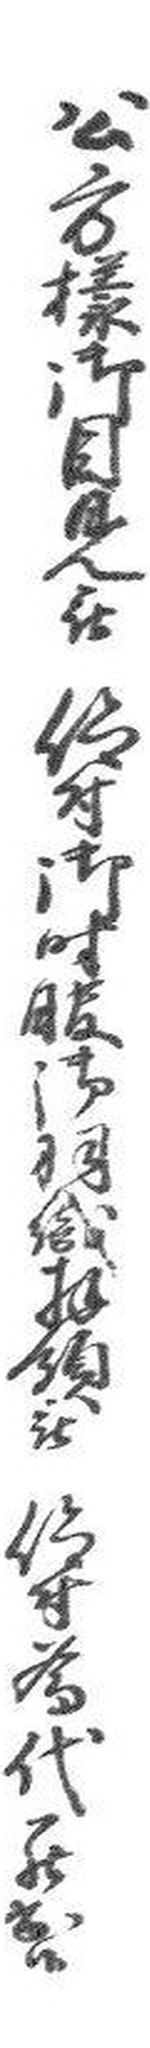公方様御目見被仰付御時服御羽織拝領被仰付為代罷出候
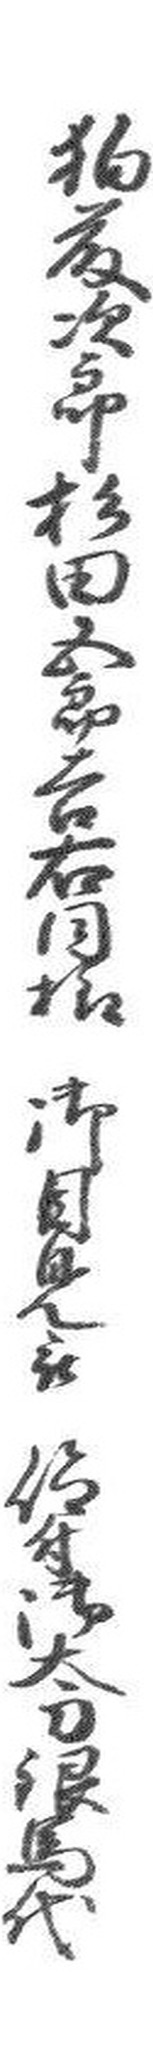狛藤次郎杉田五郎吉右同様御目見被仰付御太刀銀馬代
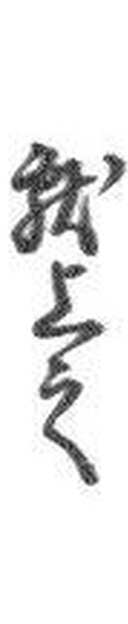献上之
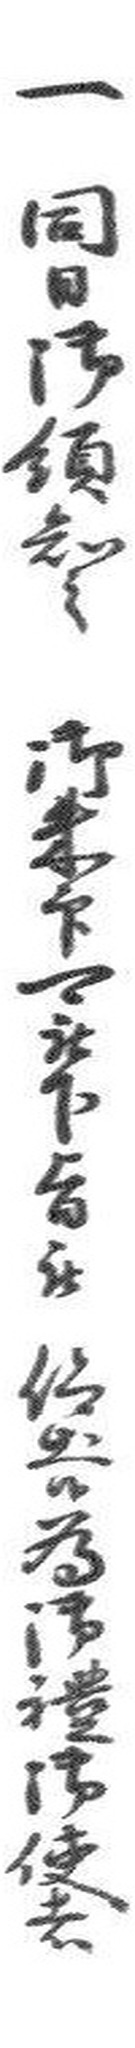一同日御領知之御朱印可被下旨被仰出候為御礼御使者
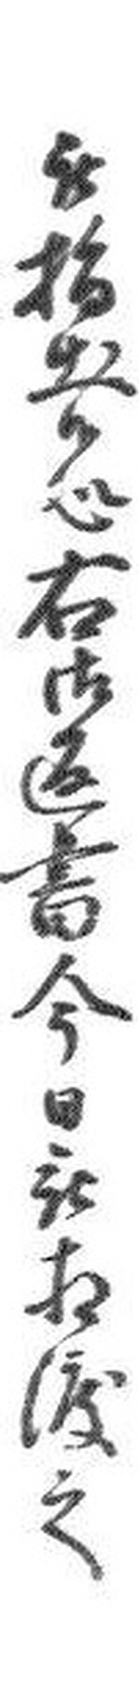被指出候処右御返書今日被相渡之
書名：家譜 七 光通公 従寛文四年到同九年
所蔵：福井県文書館 Fukui Prefectural Archives
